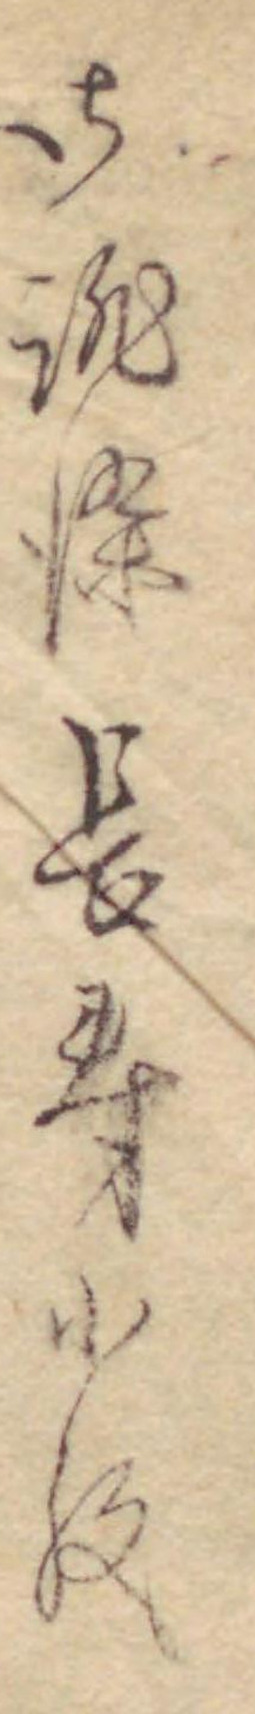御誂染長寿小紋
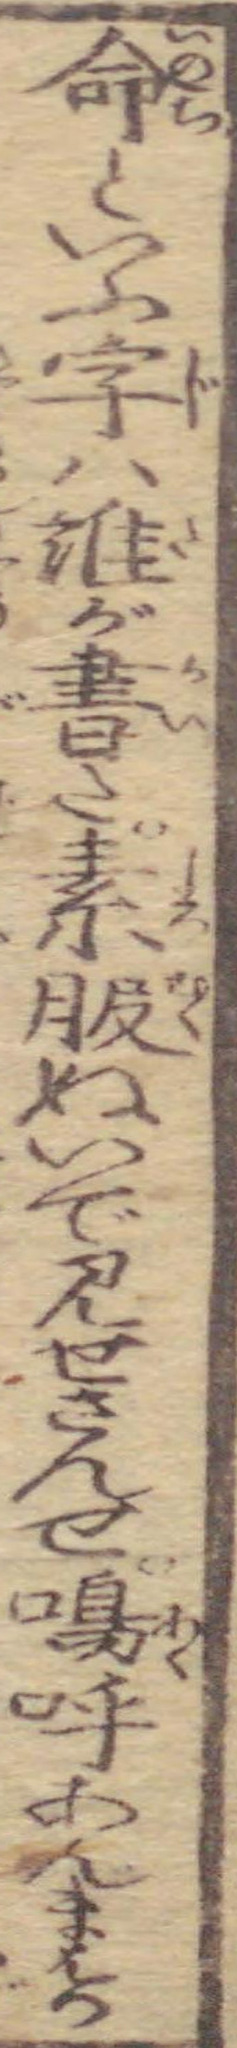命といふ字は誰が書た。素服ぬいで見せさんせ。嗚呼あんまはり
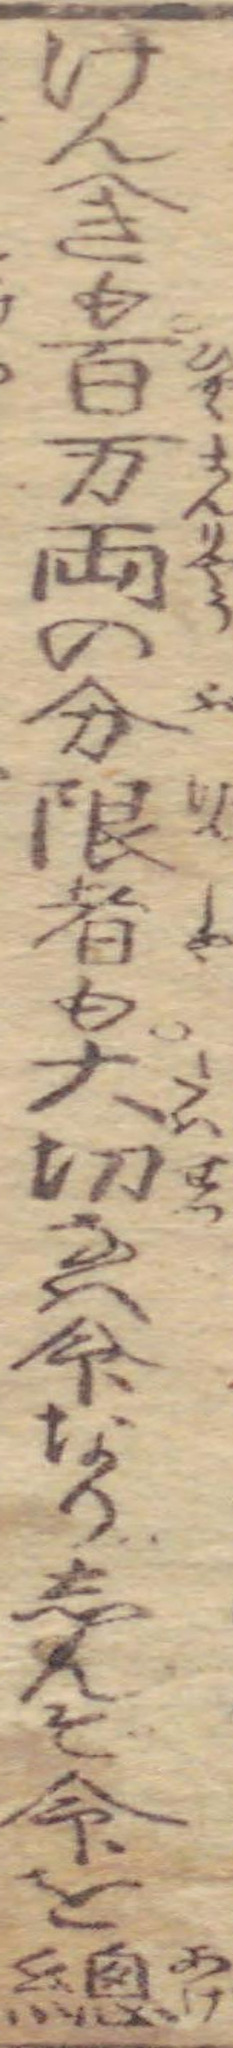けんへきも。百万両の分限者も。大切なは命なり。しんそ命を総
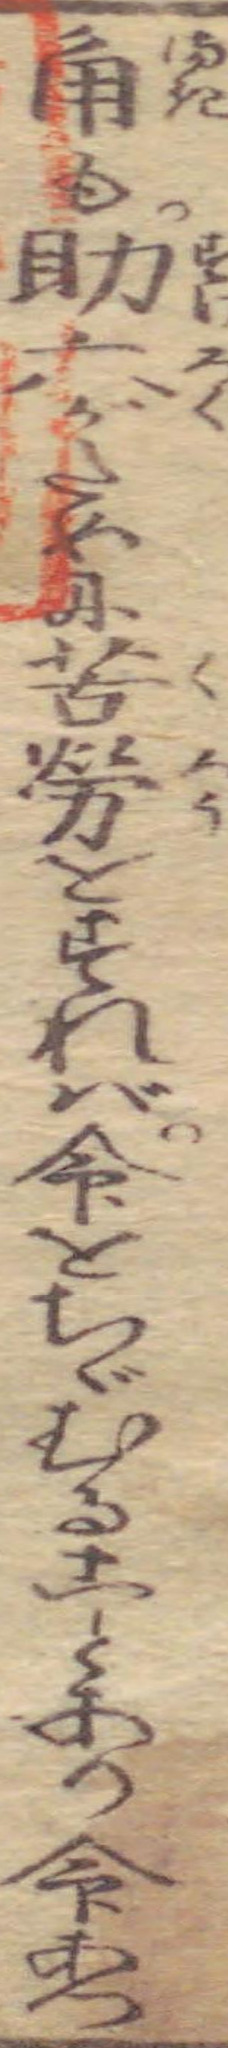角も。助六がために苦労をすれば。命をちゞむることあり命あつ
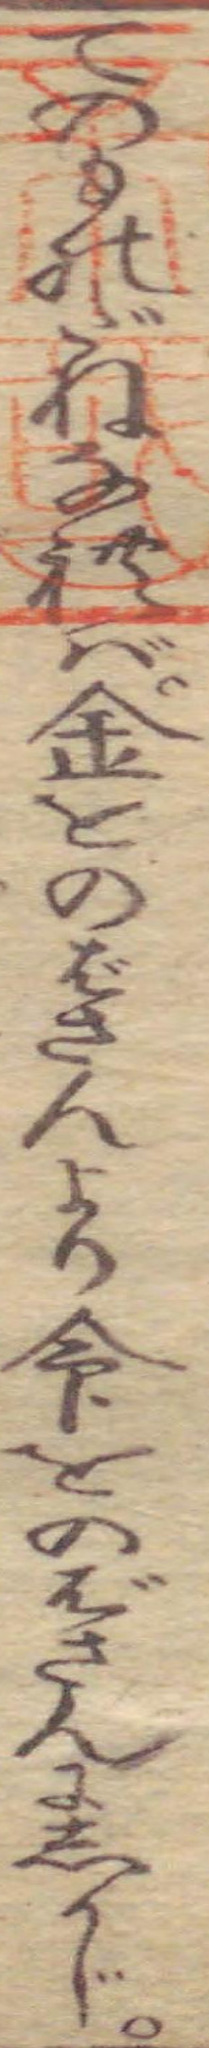てのものだねなれば。金をのばさんより命をのばさんにしかじ。
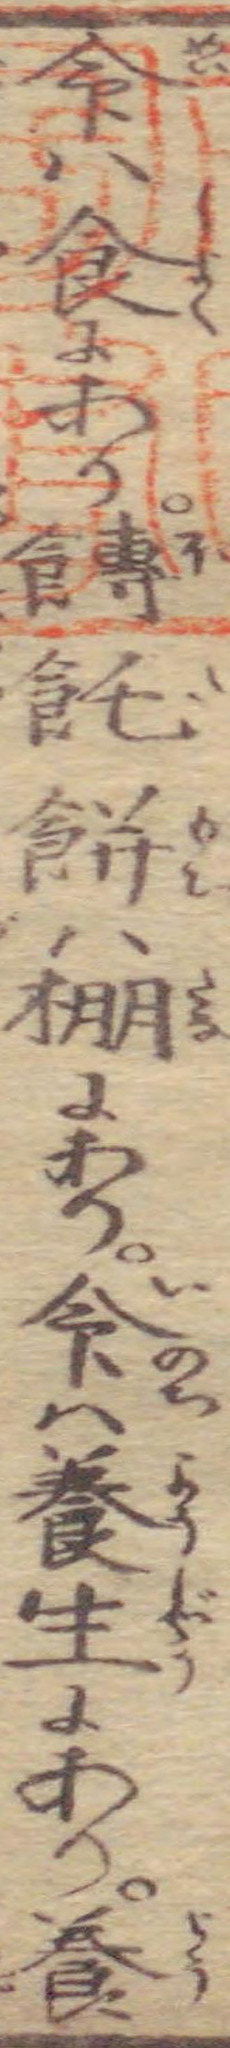命は食にあり。餺飥餅は棚にあり。命は養生にあり。養
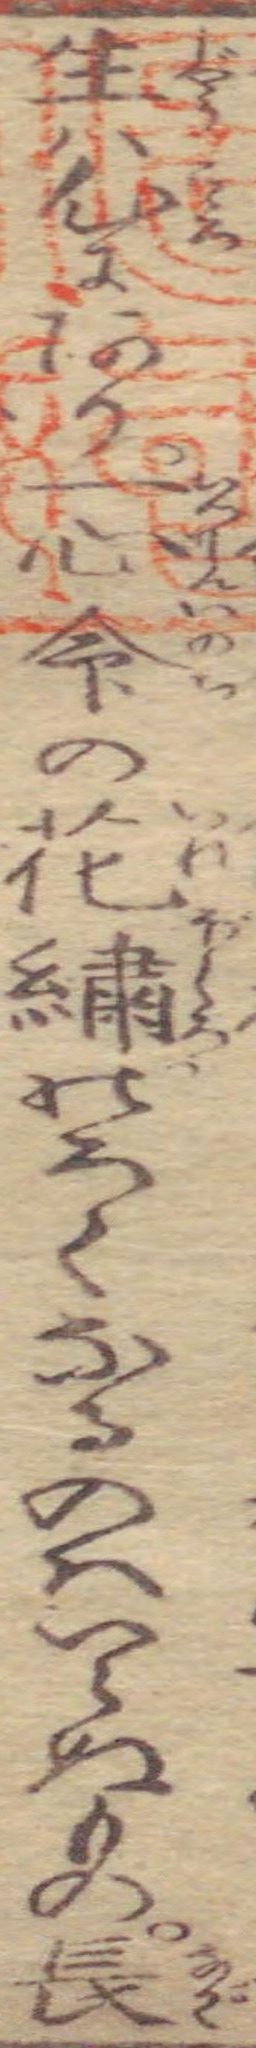生は心にあり。一心命の花繍。のろくなるのはいらぬもの。長
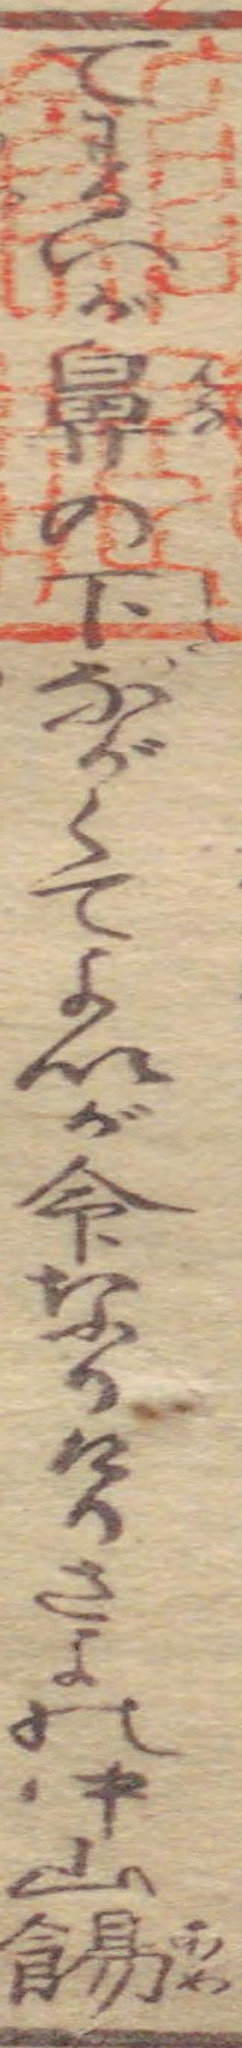てわるいが鼻の下。ながくてよいが命なりけりさよの中山餳
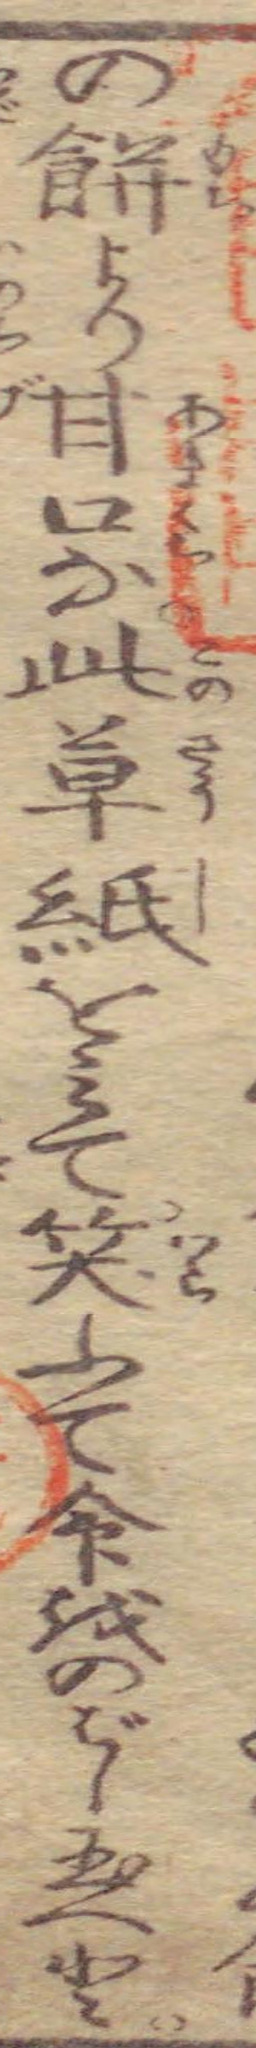の餅より甘口な。此草紙をみて笑ふて命をのばし玉へと。
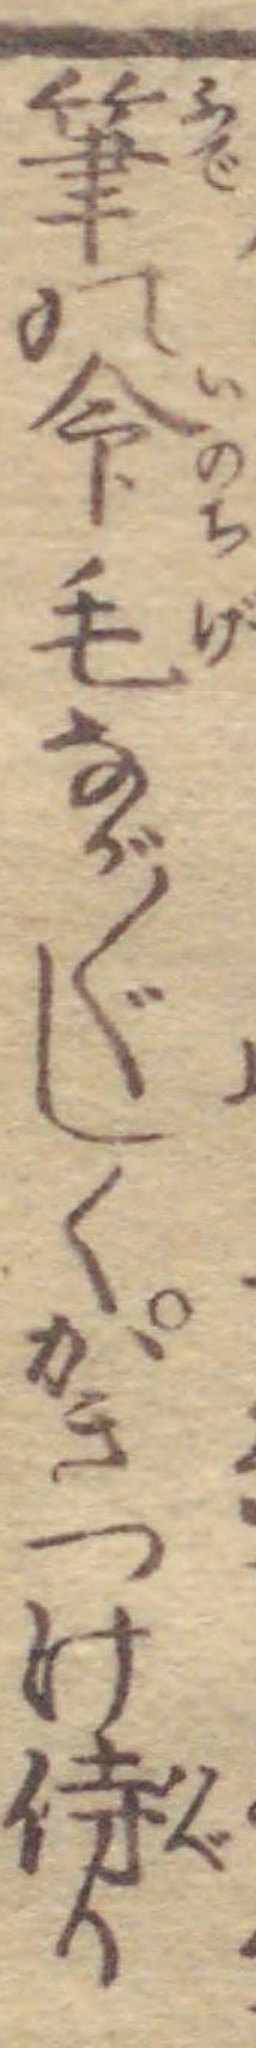筆の命毛なが〴〵しく。かきつけ侍り
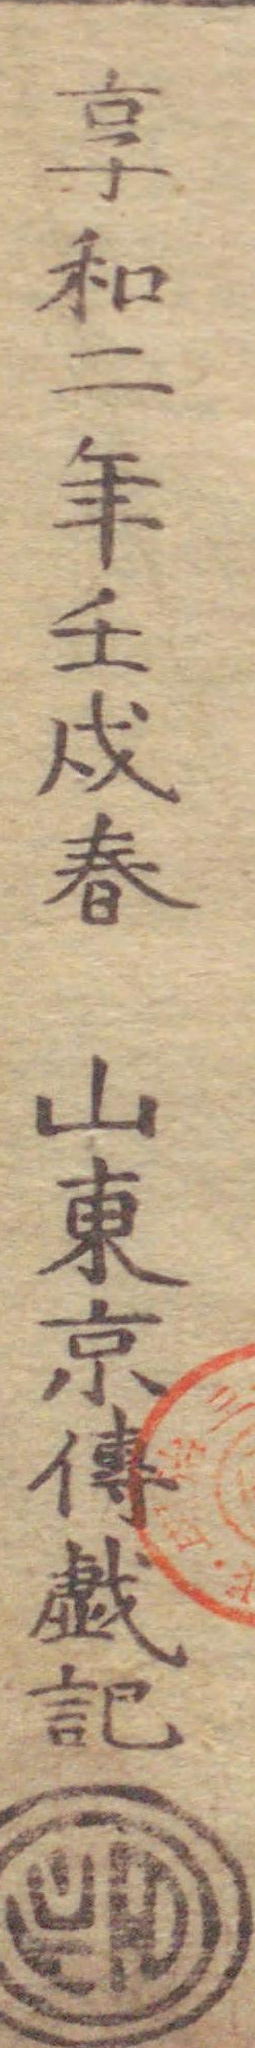享和二年壬戌春山東京伝戯記

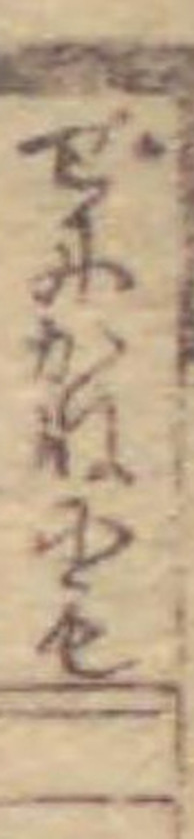ぜにかねにも
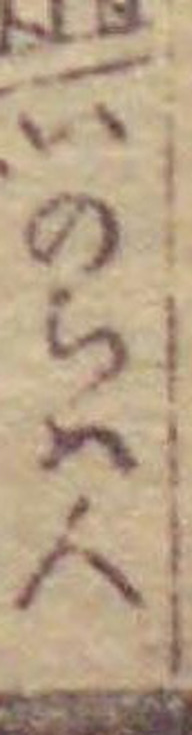いのちは人
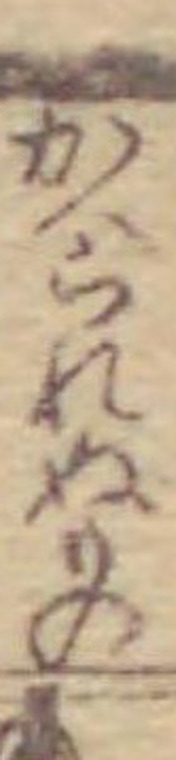かへられぬもの
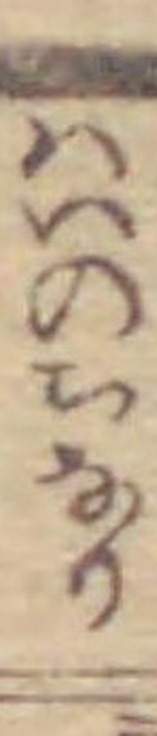はいのちなり
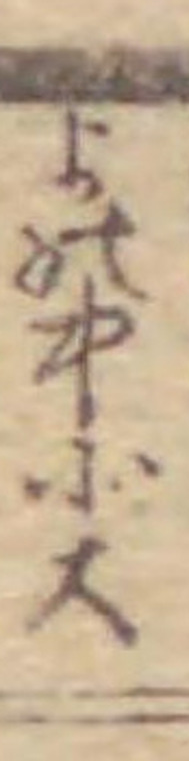よの中に大
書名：御誂染長寿小紋 : 3巻
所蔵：国立国会図書館 National Diet Library, JAPAN
